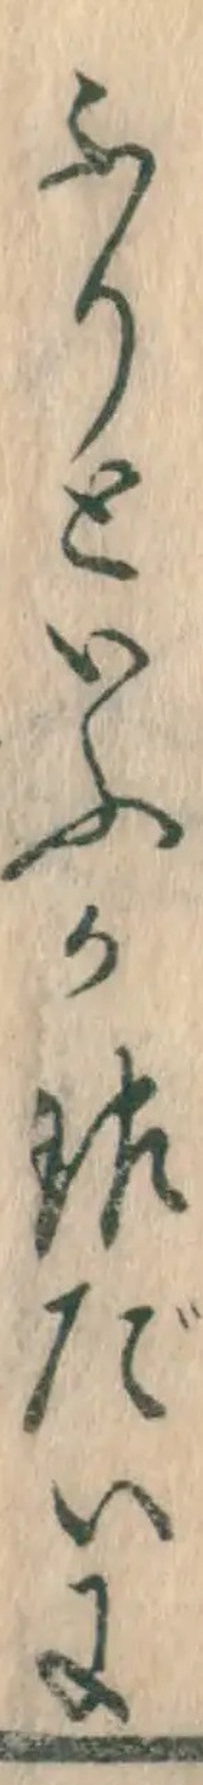ふりといふか銀だいに
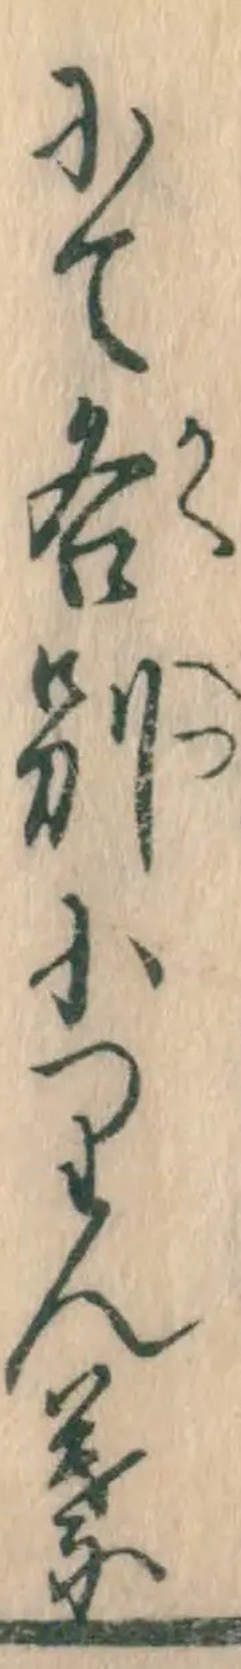にて各別小りん葉
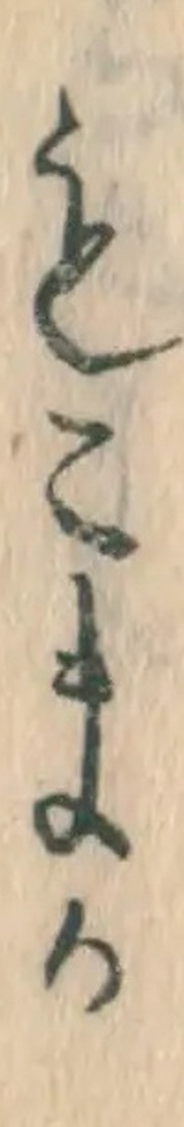もこまか

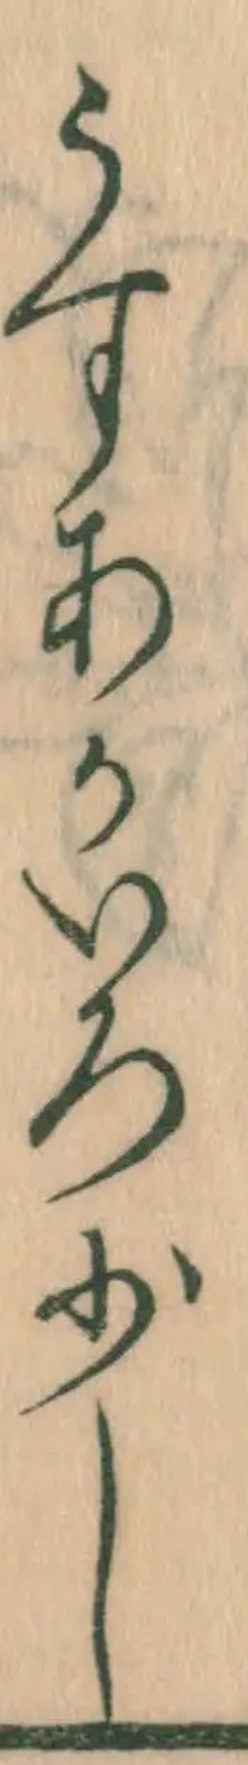うすあかいろ少し
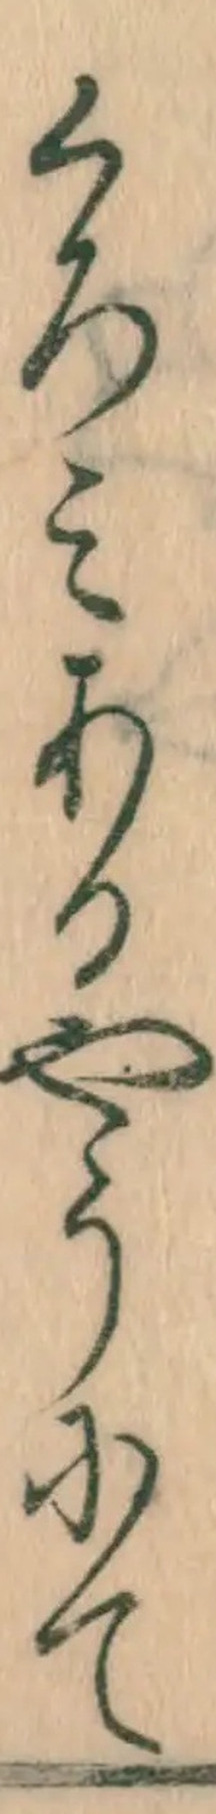くろみあるやうにて
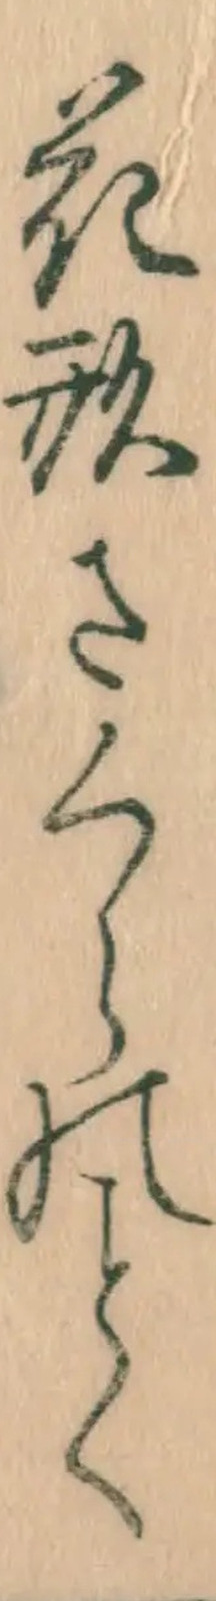花形さくらのことく
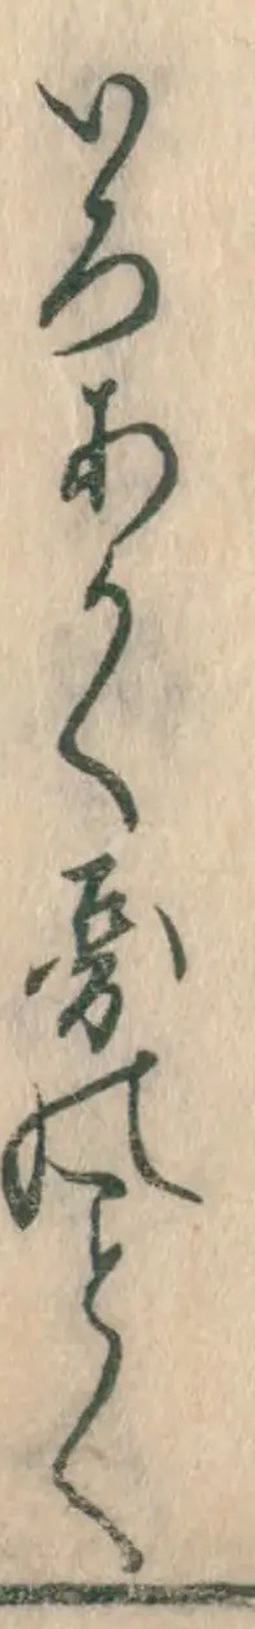いろあかく図のことく
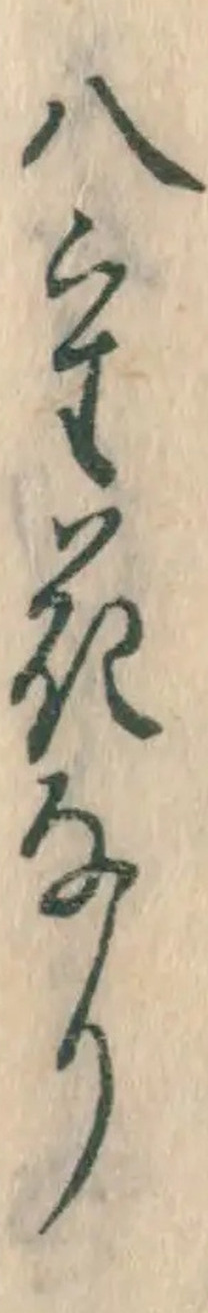八重花なり

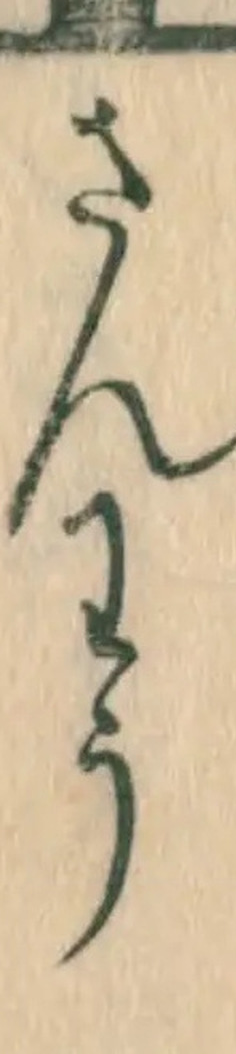さんわう
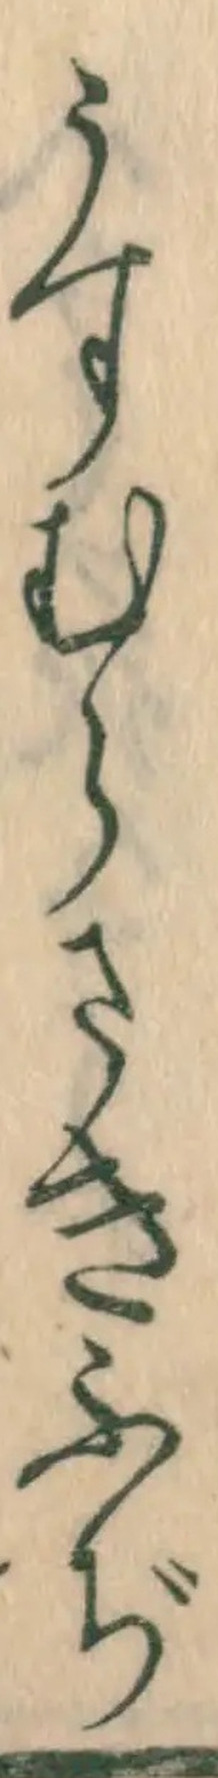うすむらさきふぢ
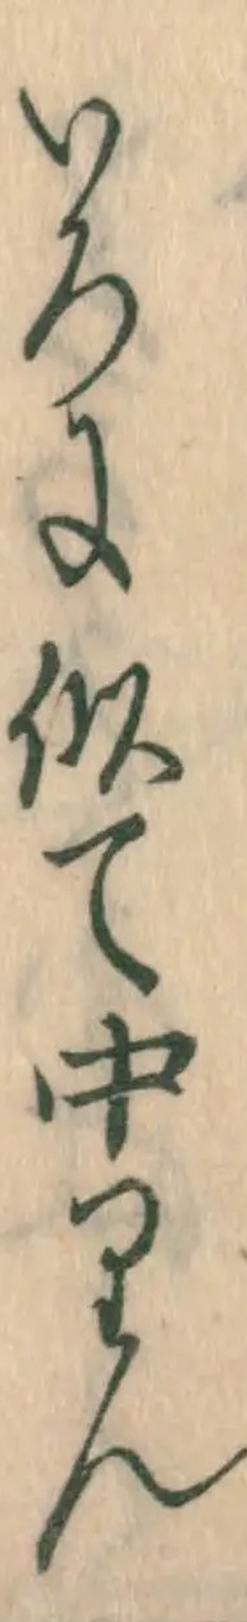色に似て中りん
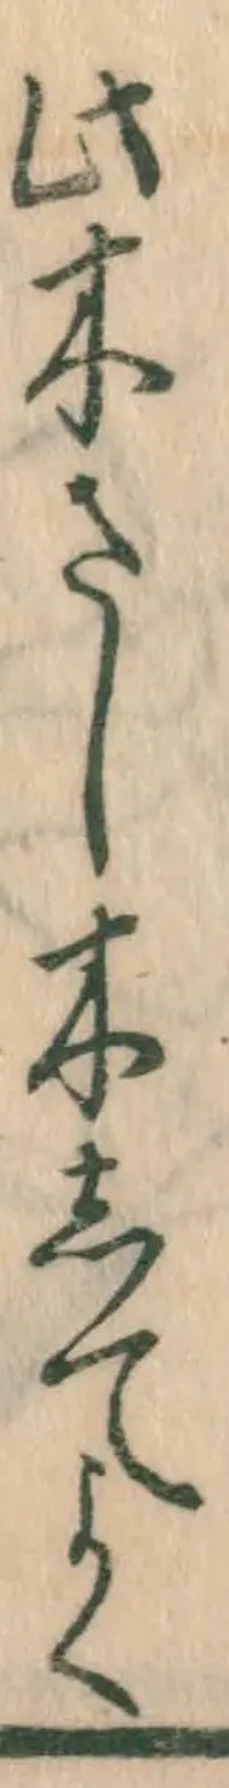此木さし木してよく
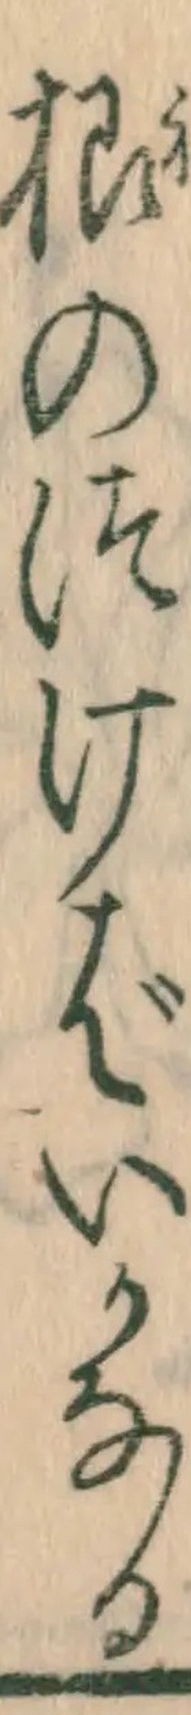根のつけばいかなる
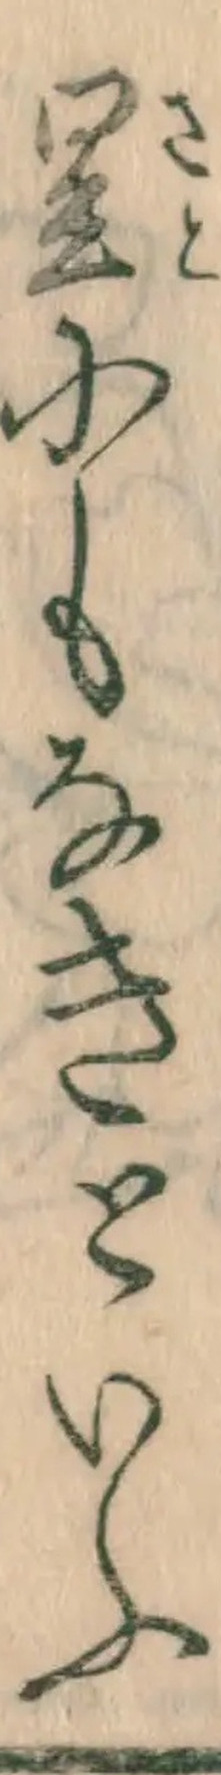里にもなきといふ
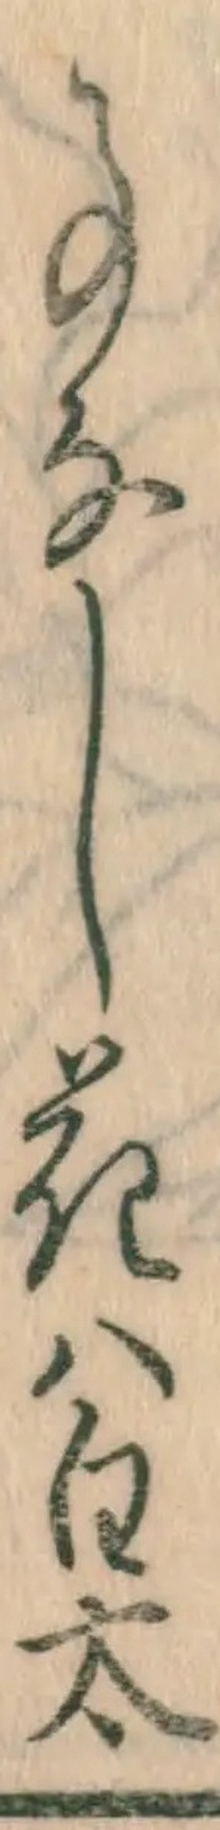事なし花は白太
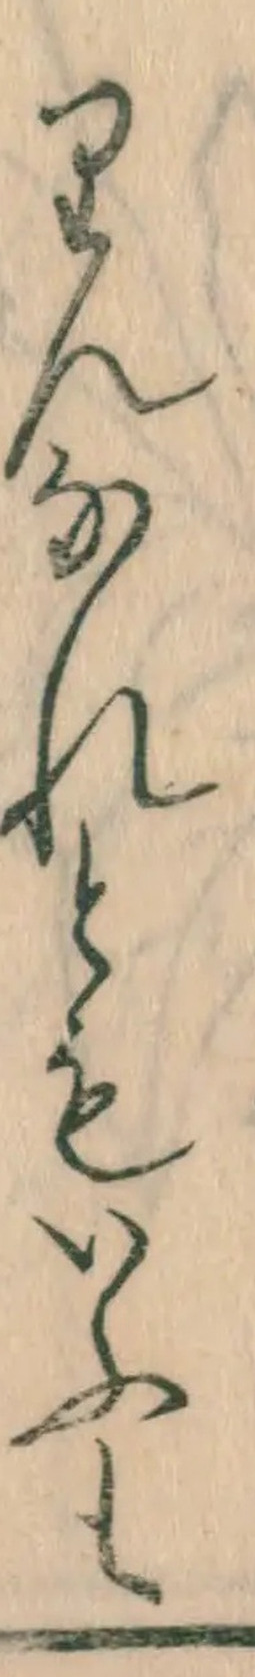りんなれともいふも
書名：錦繍枕 5巻. [1]
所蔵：国立国会図書館 National Diet Library, JAPAN
